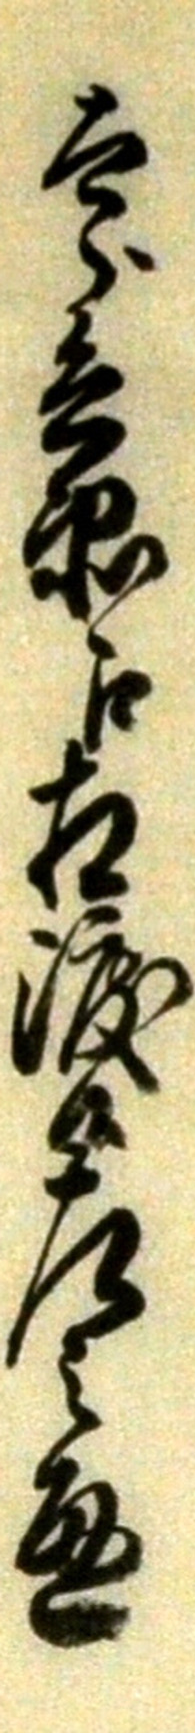太郎兵衛江相渡候左之通
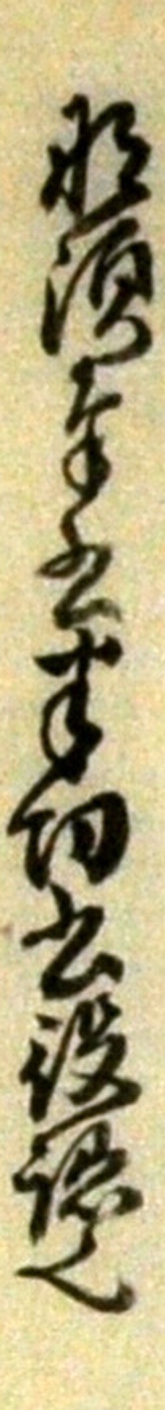那須奉書半切書役認成
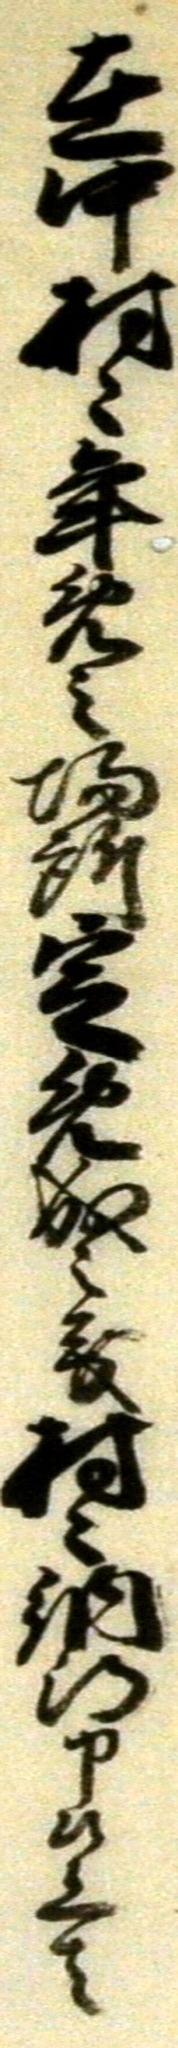在中村々年免之場所定免成之義村々納得申候上者
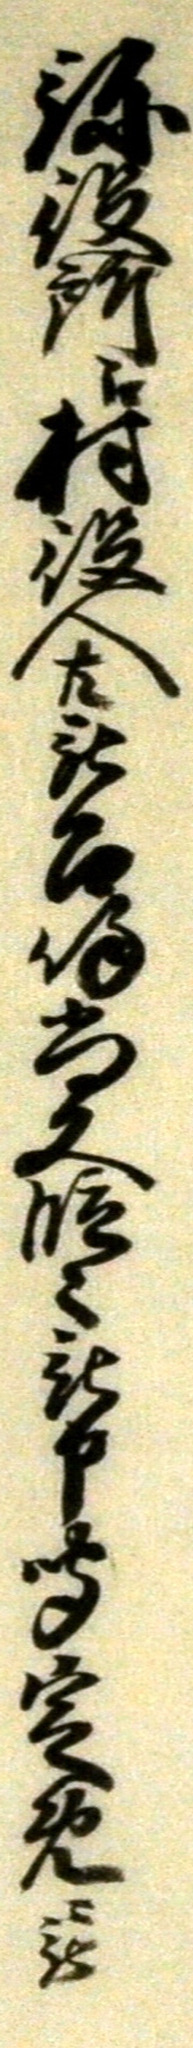弥役所江村役人共被召呼尚又段々被申聞定免ニ被
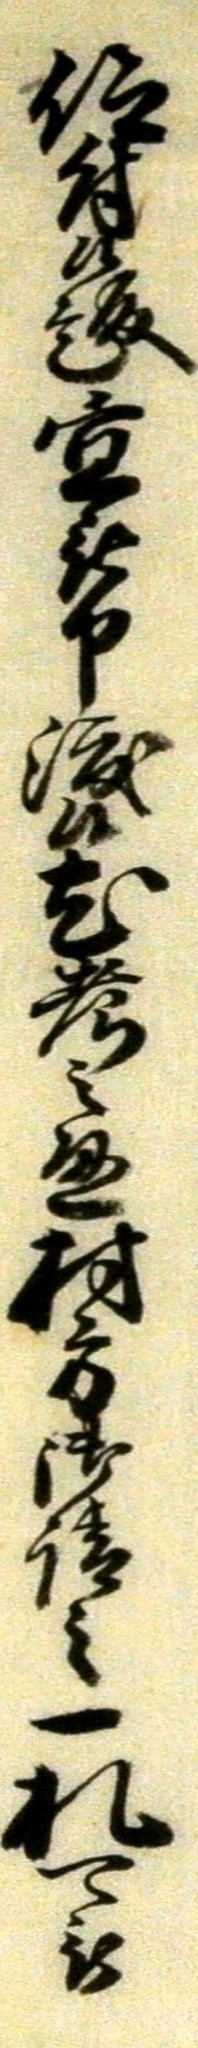仰付候趣宜被申渡候尤考之通村方御請之一札可被
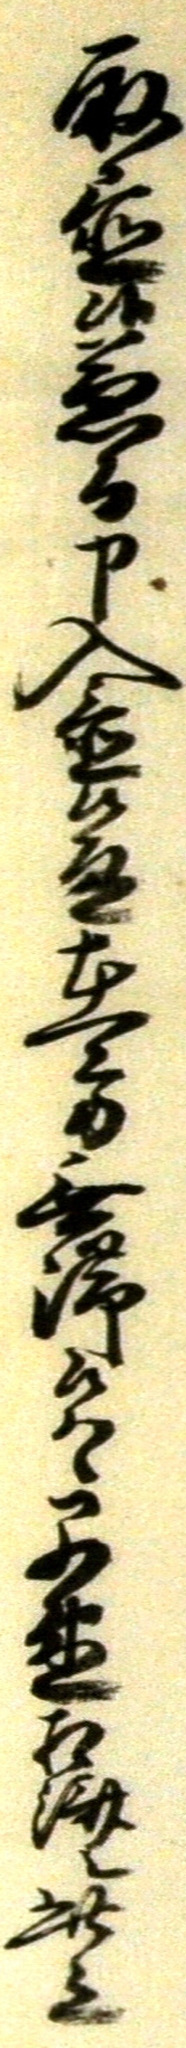取置候兼而申入置候通在方無滞候ハヽ早速相済シ此上

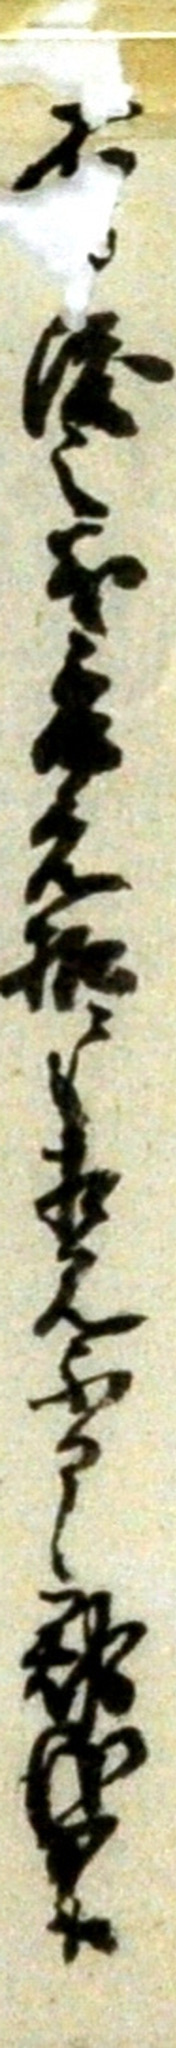右申渡之外爰元控ニも相見不申候郡代江
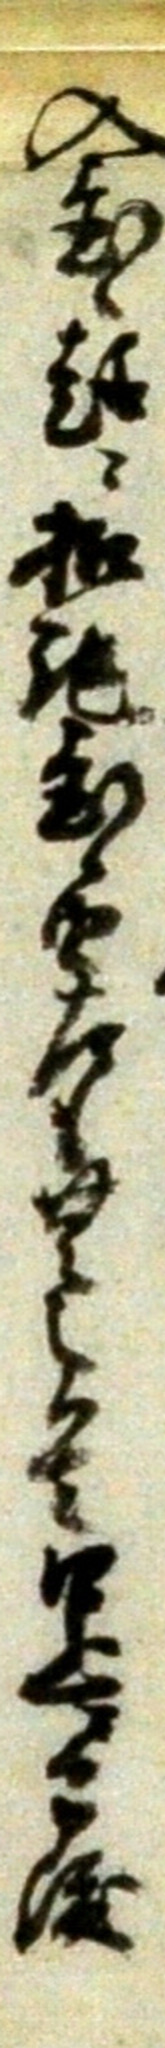入置候趣ニ控記置候由左も無之候者口上ニ而申渡
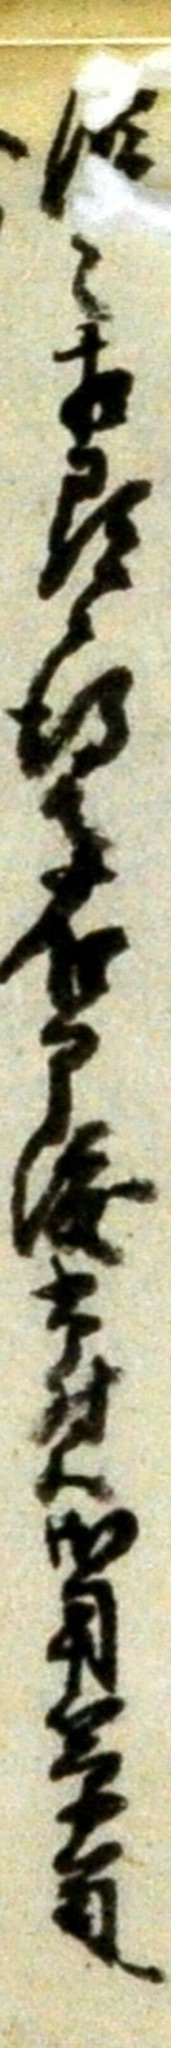段々相尋候得者右申渡書付ハ御用
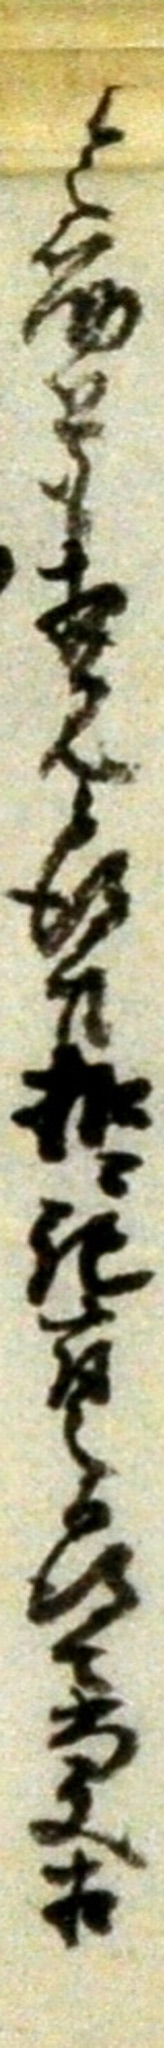筋とも相見候得共控ニ記有之候得者尚又相
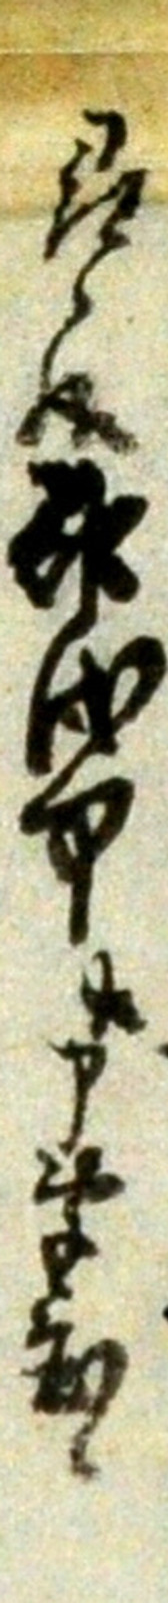尋候様郡代中江申聞置候

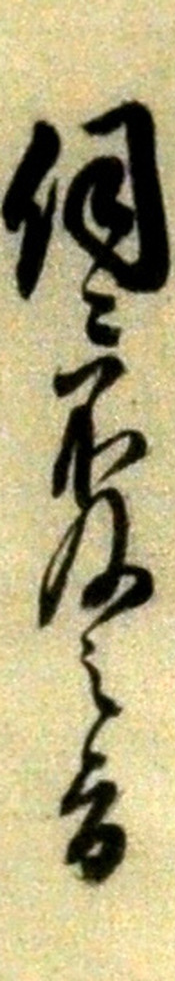伺ニ不及之旨
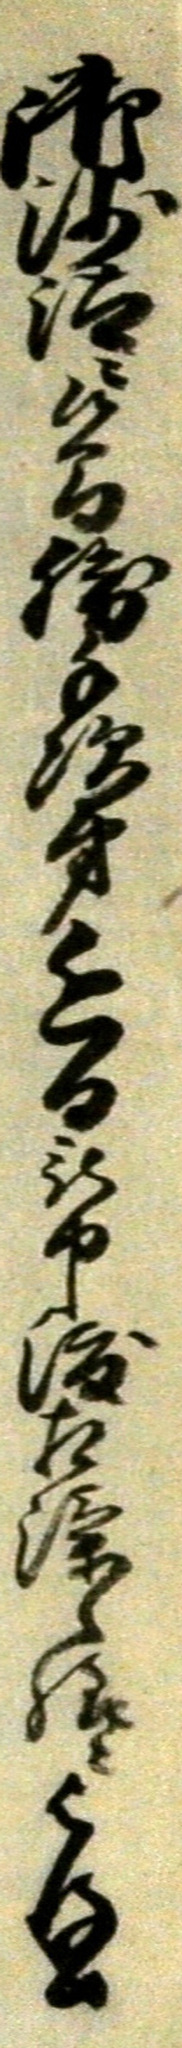御沙汰ニ候間勝手次第近日被申渡相済候様ニと存候
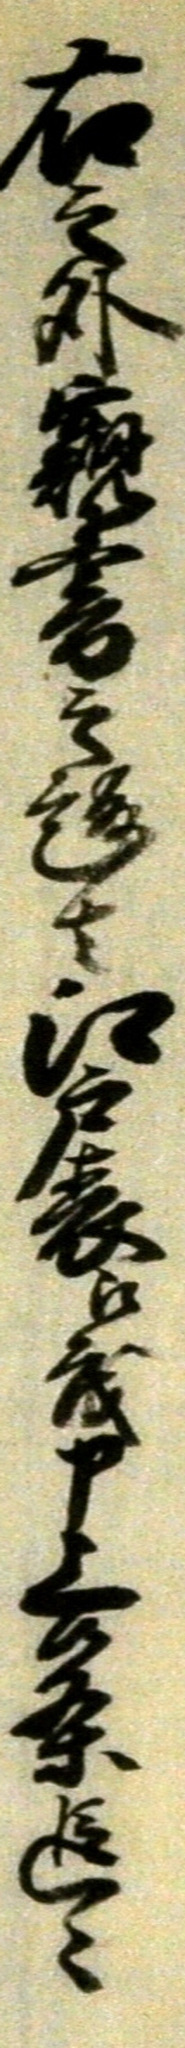右之外窺書之趣者江戸表江茂申上候条追々
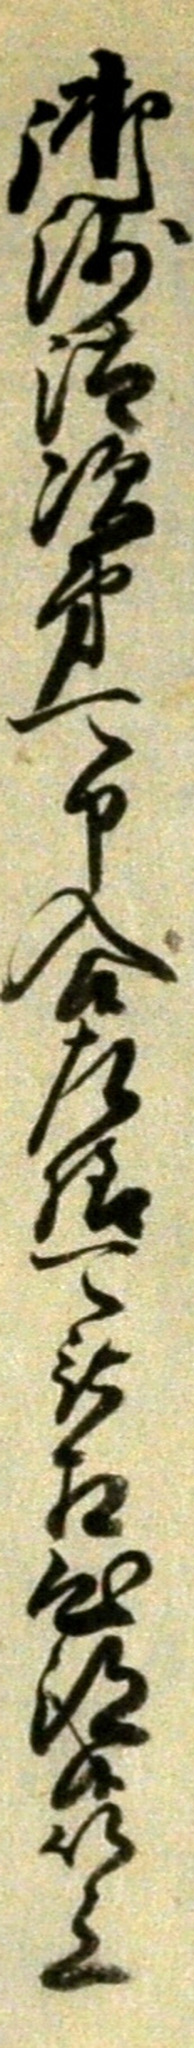御沙汰次第可申入候左様可被相心得候以上
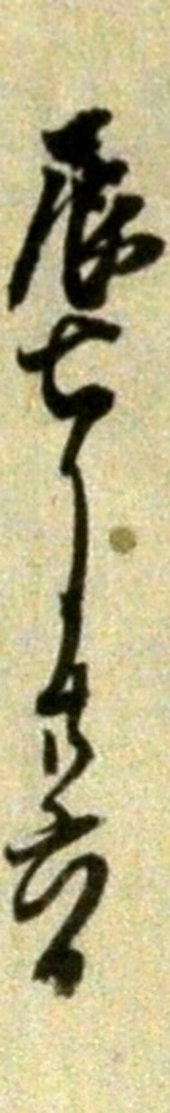辰七月廿六日
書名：留書
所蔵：伊那市立高遠町図書館・合同会社AMANE
